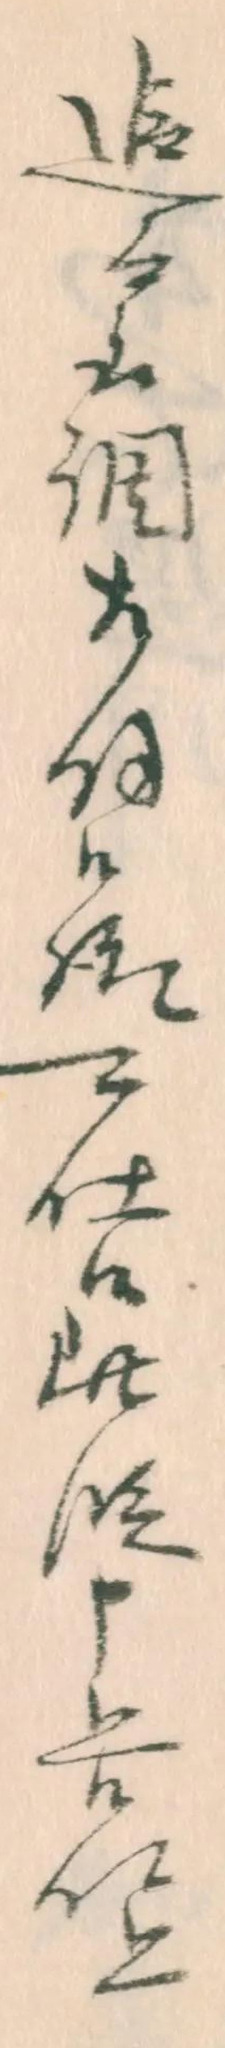追而取調相伺候様可仕候此段申上候以上
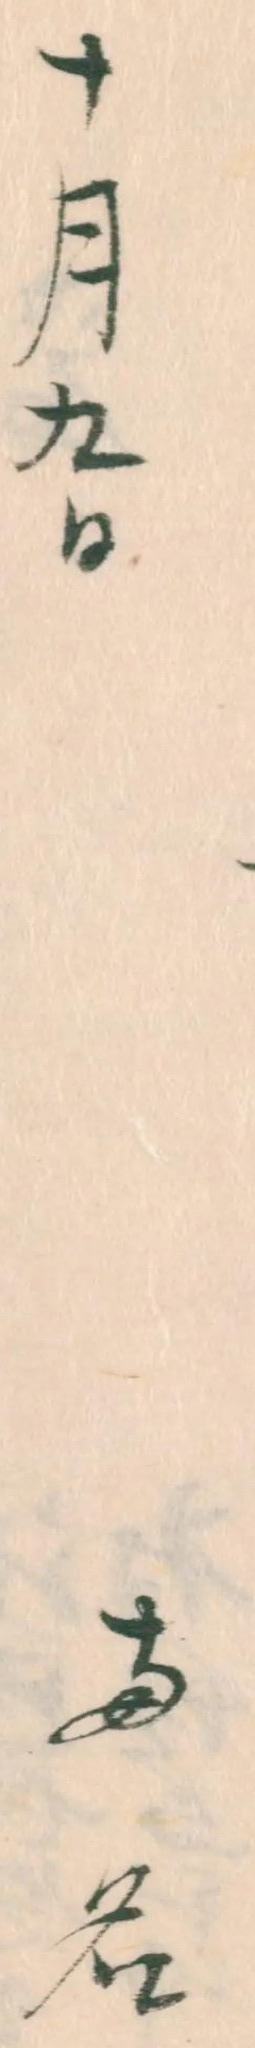十月九日両名
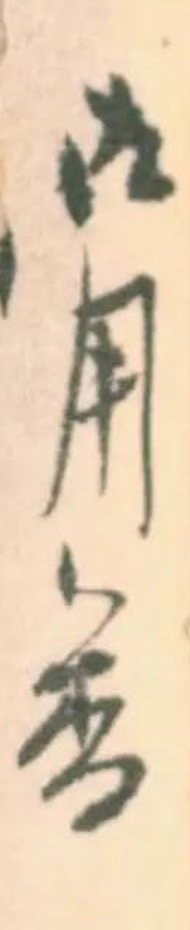御用番
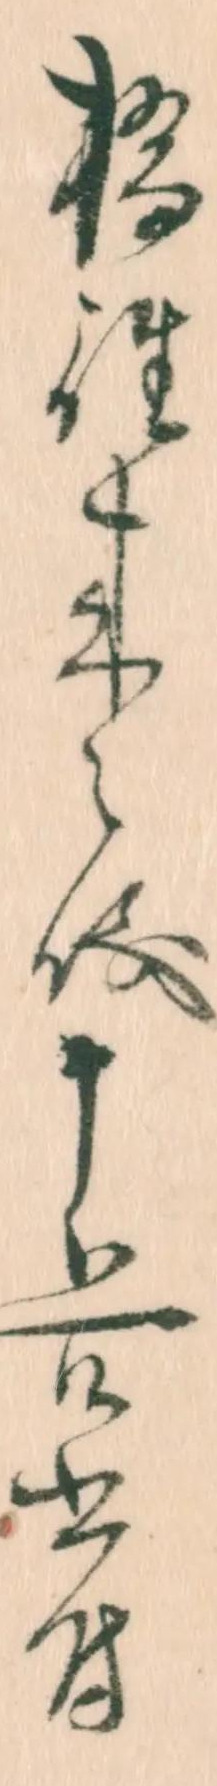橋往来之儀申上候書付
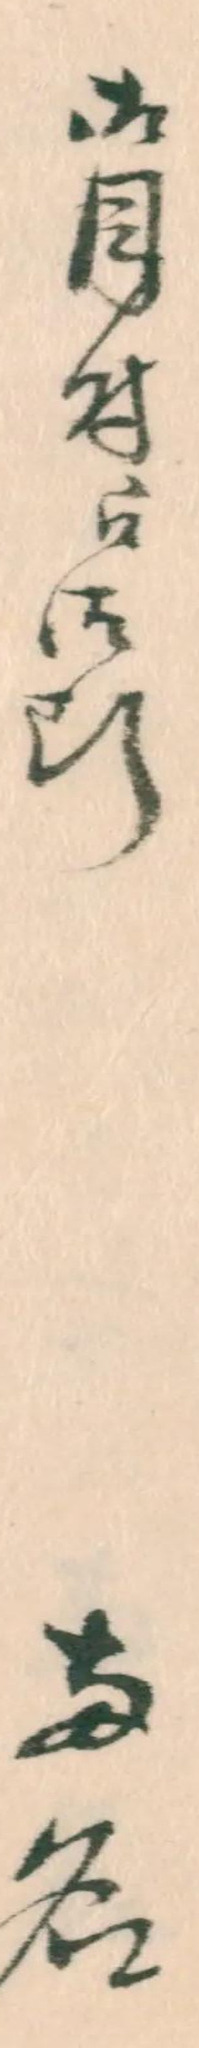御目付え御断両名
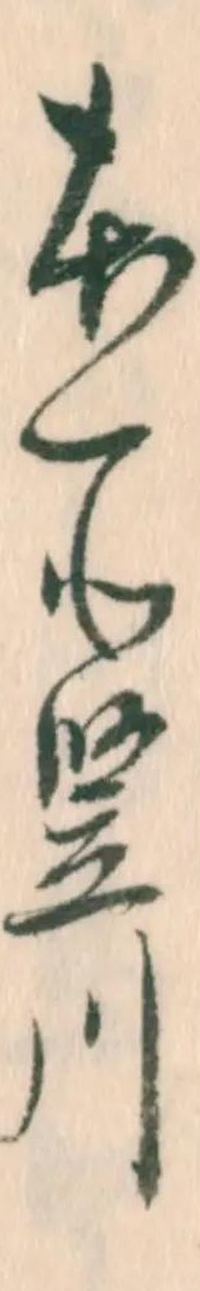本所竪川
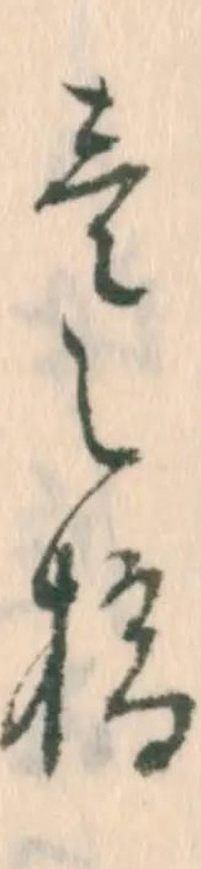壱之橋
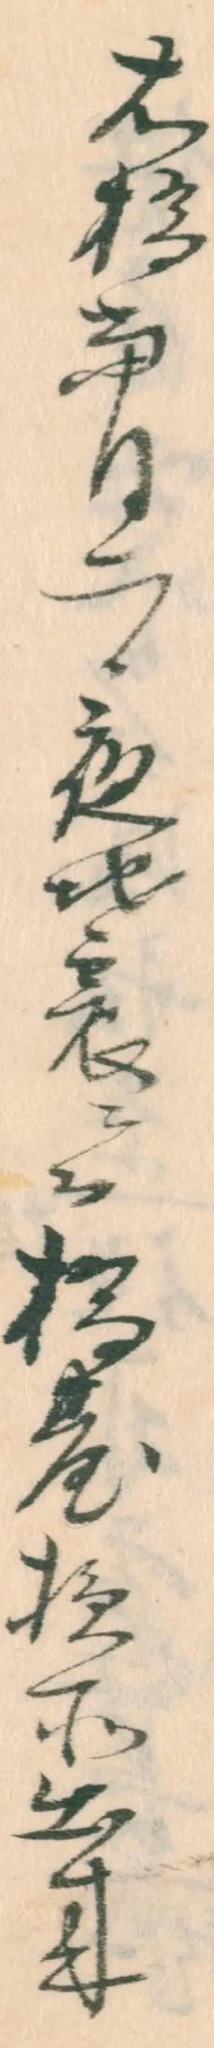右橋当月二日夜地震ニ而橋台損所出来
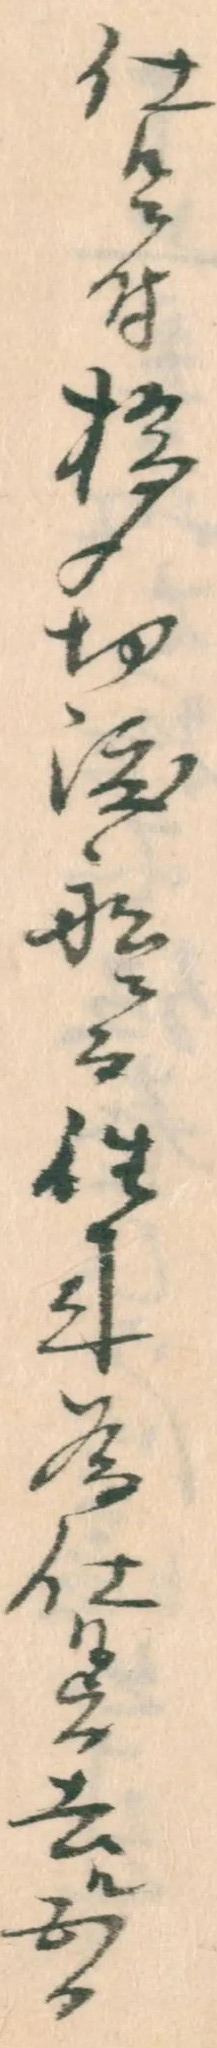仕候ニ付橋〆切渡船ニ而往来為仕候旨去ル五日

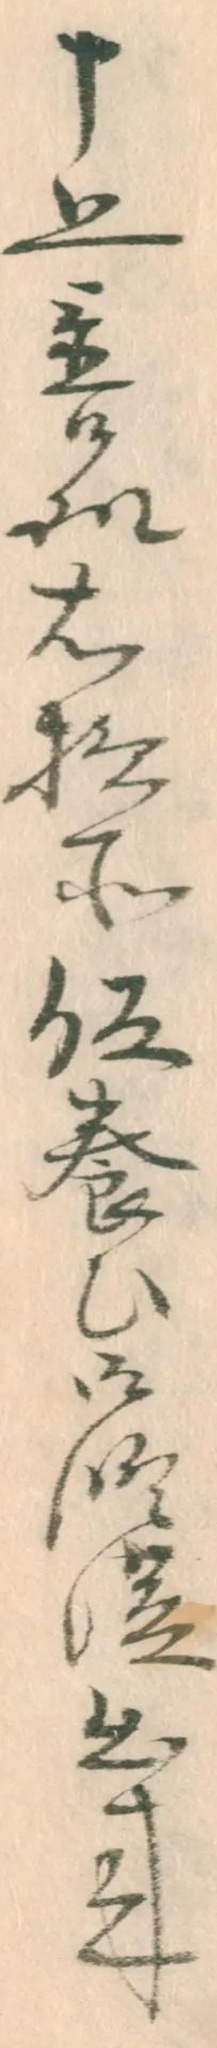申上置候処右損所仮養ひ御修復出来
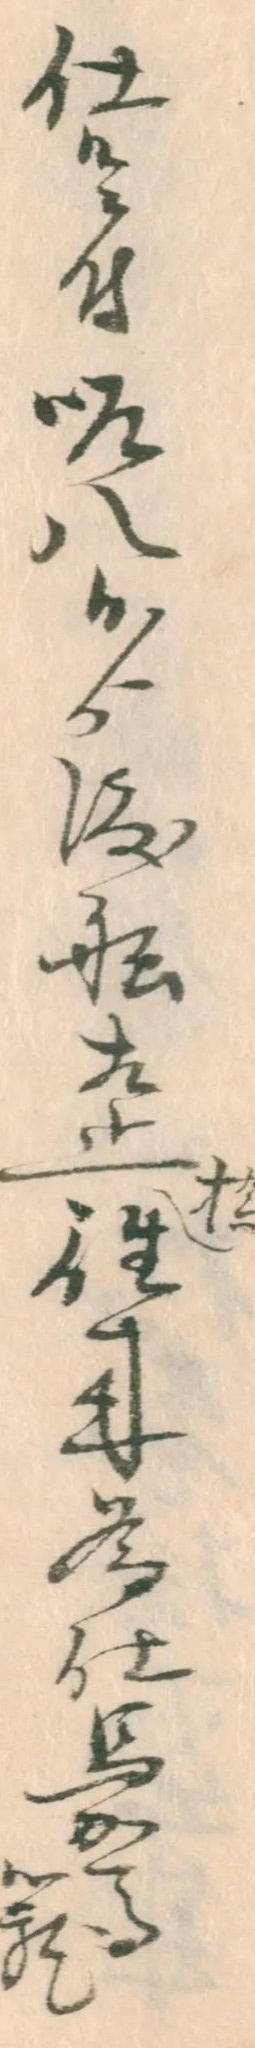仕候ニ付昨八日ゟ渡船相止橋往来為仕馬駕籠
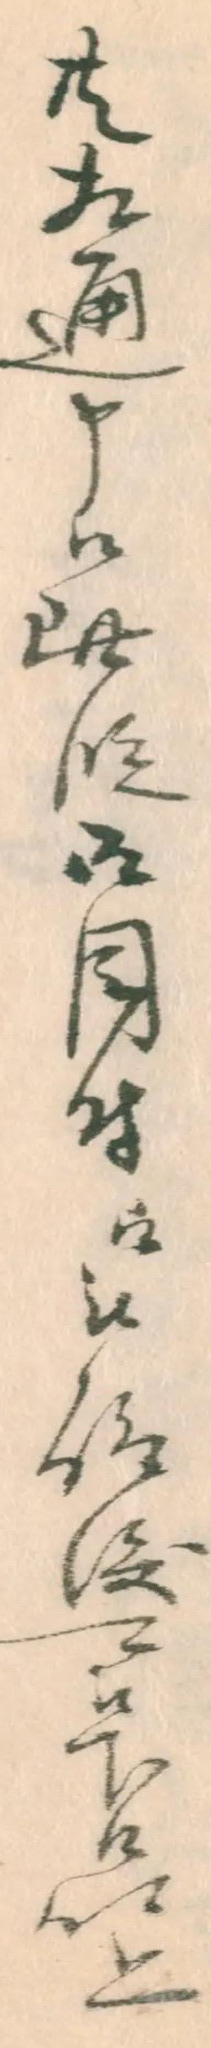共相通申候此段御目付え被仰渡可被下候以上
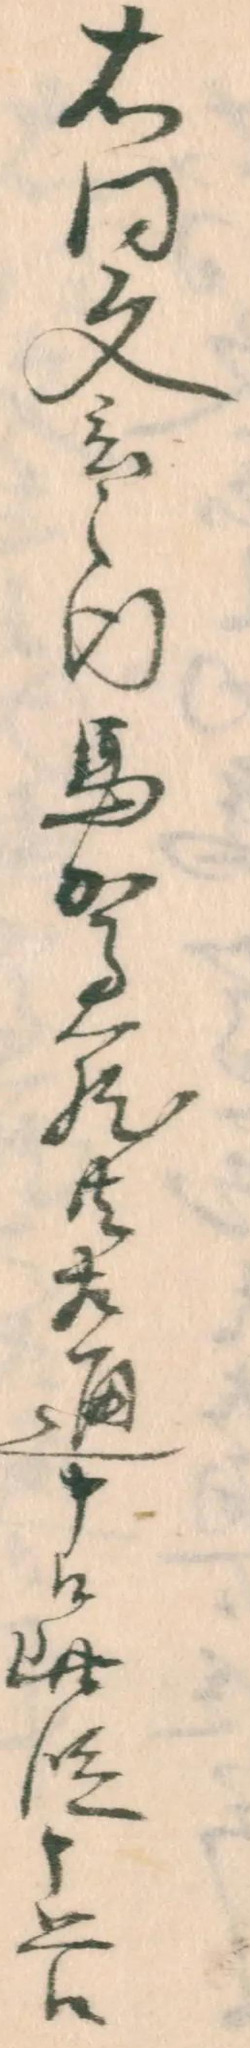右同文言之内馬駕籠共相通申候此段申上候

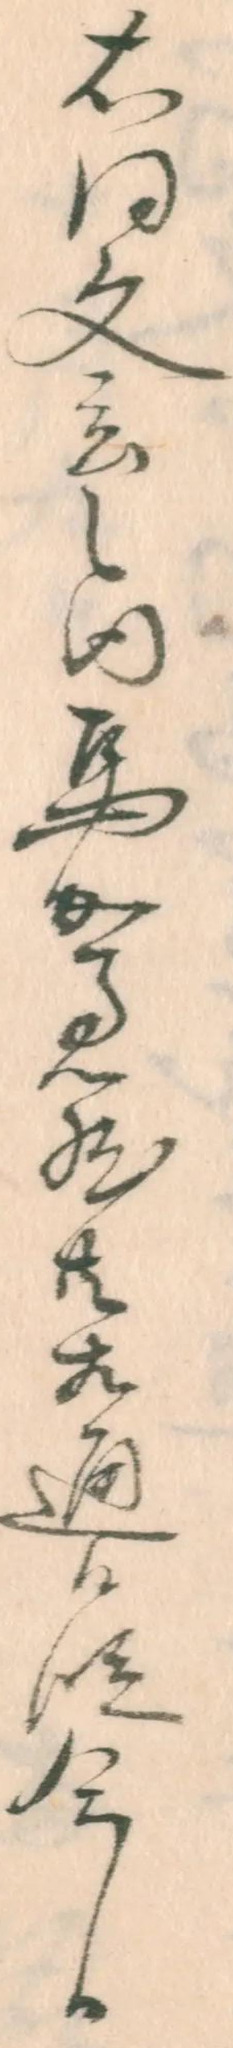右同文言之内馬駕籠共相通候段今日
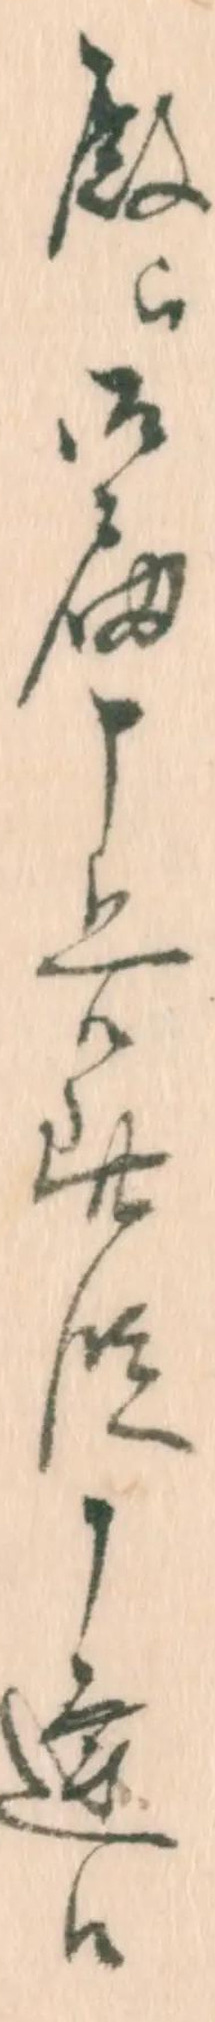殿え御届申上候段申達候
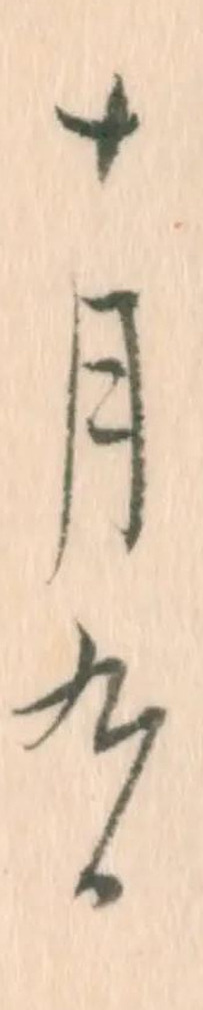十月九日
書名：地震災書留 2巻. [1] 内表紙に「地震災書留　安政二卯年　但本所深川御用屋敷地代免除調」とあり
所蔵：国立国会図書館 National Diet Library, JAPAN
